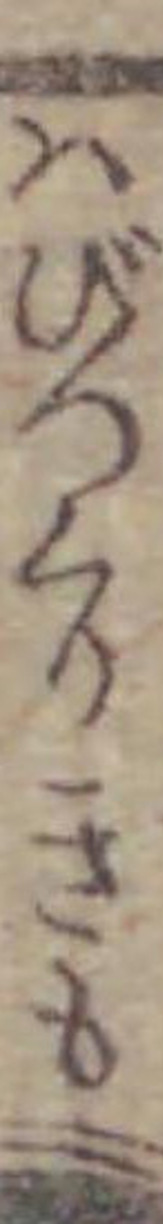はびつくりきも
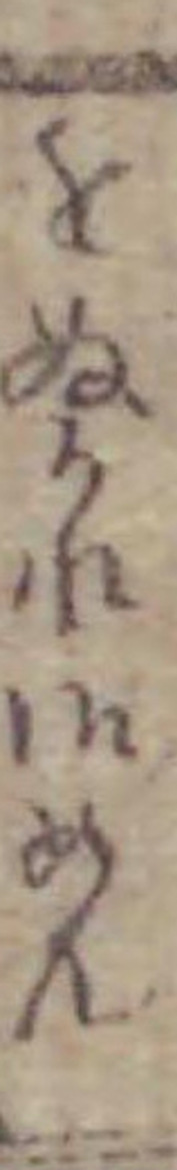をぬかれ御めん
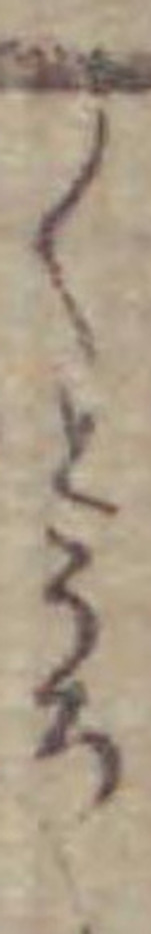〳〵とうろ
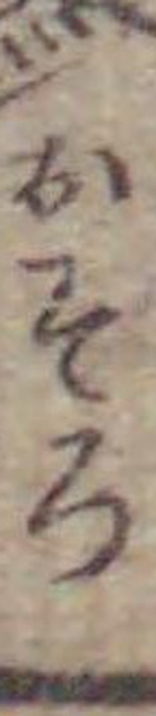おそろ
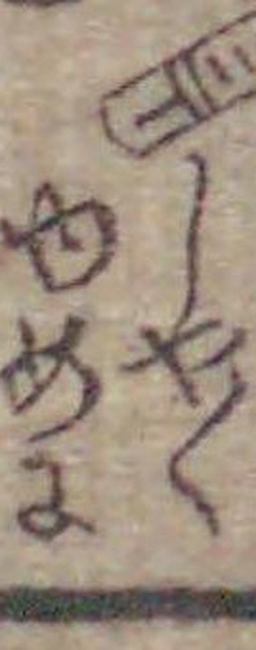ゆめに
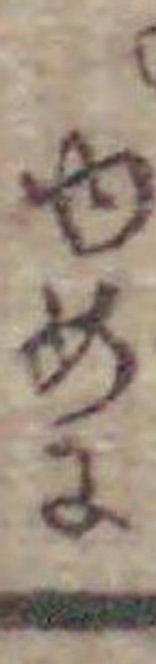ゆめに
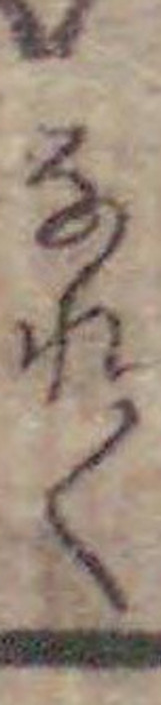なれ〳〵
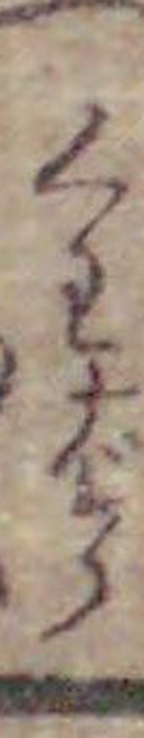くわばら
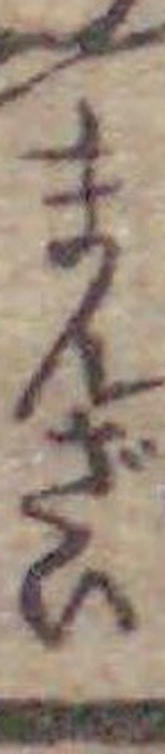まんざい

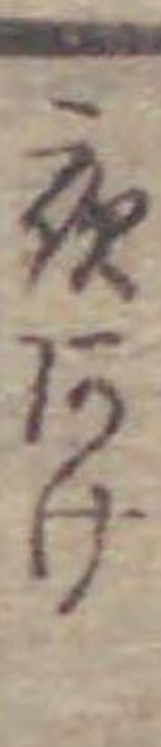夜あけ
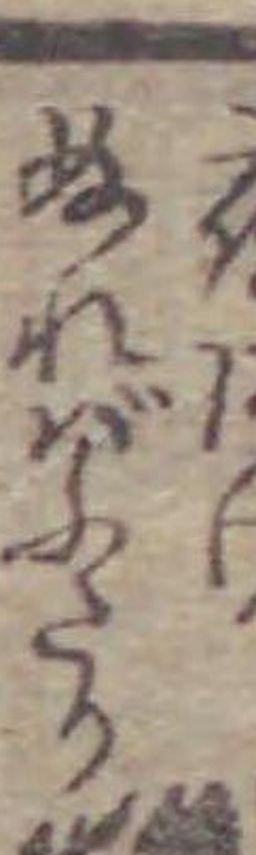ぬればふたり
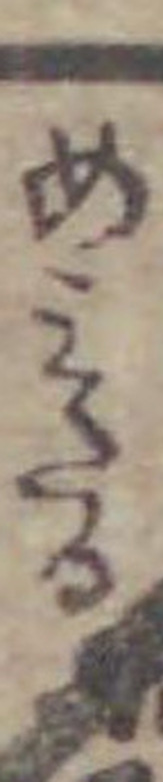めみたる
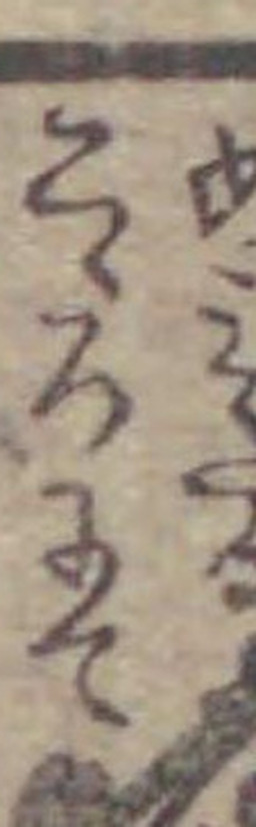こゝろにて
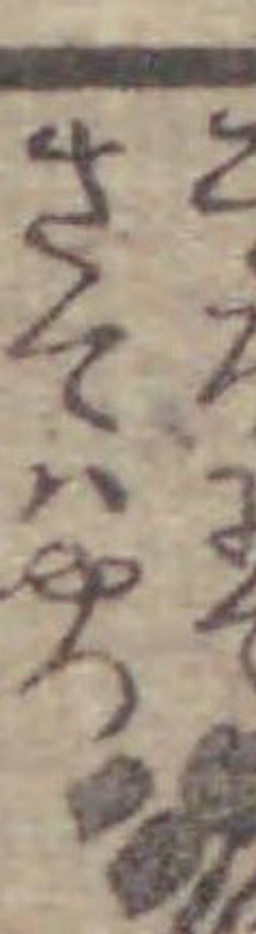さてはやつ
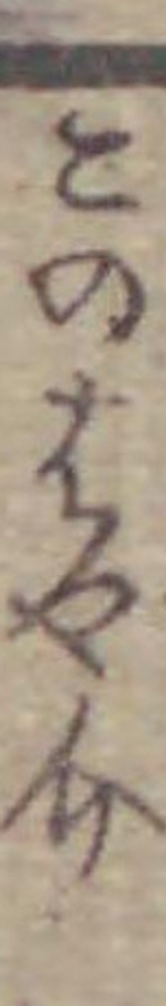このはや介
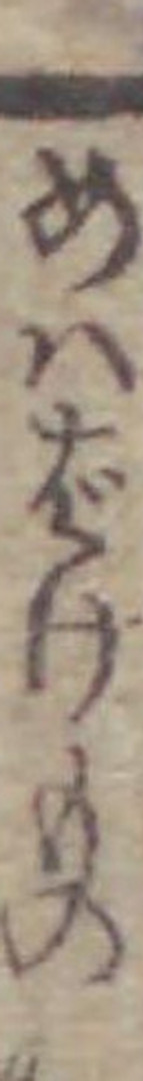めはばけもの
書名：二日替 : 2巻
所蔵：国立国会図書館 National Diet Library, JAPAN
